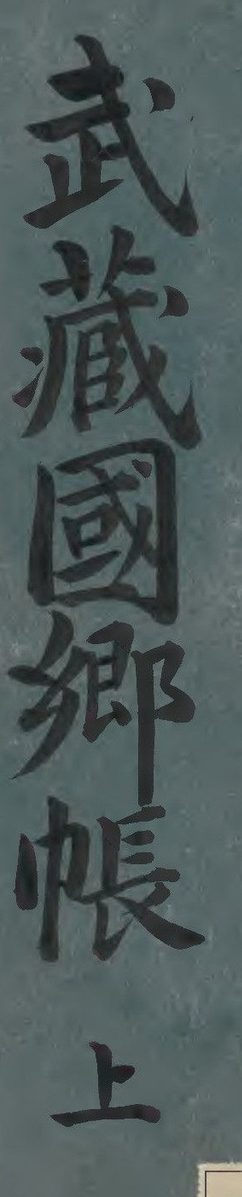武蔵国郷帳上

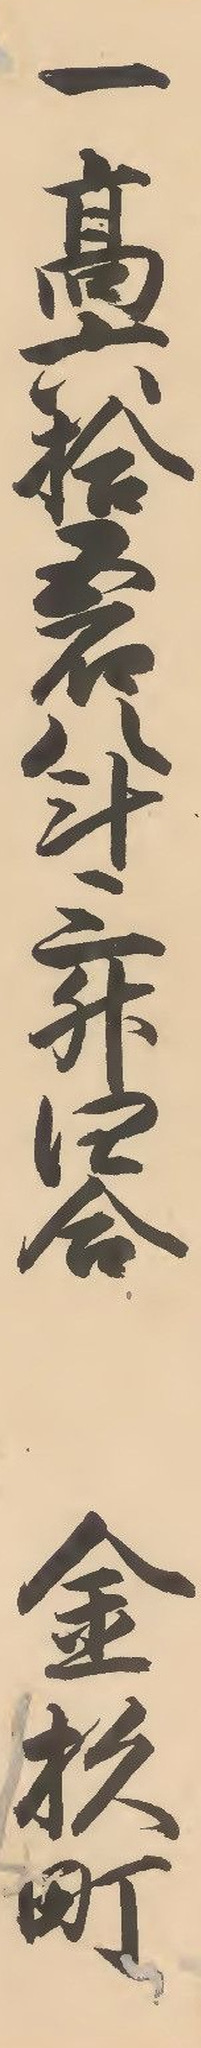一高六拾五石八斗三升四合金杉町
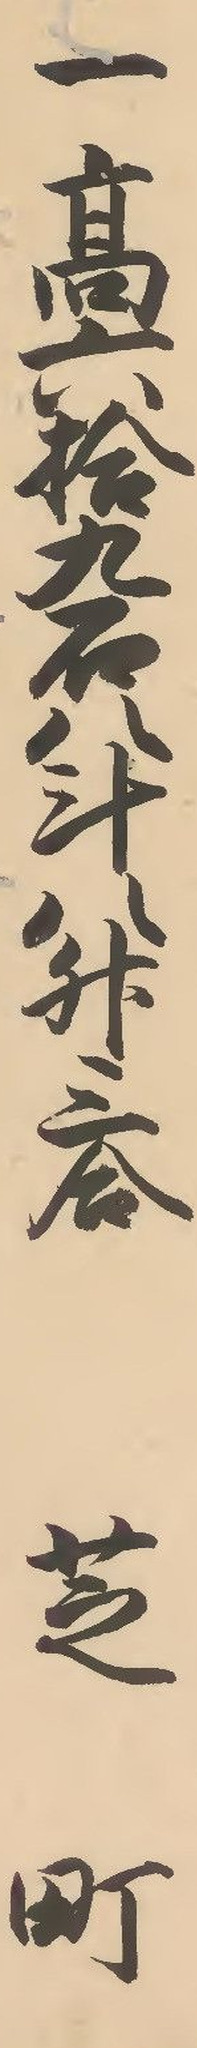一高六拾九石八斗八升三合芝町

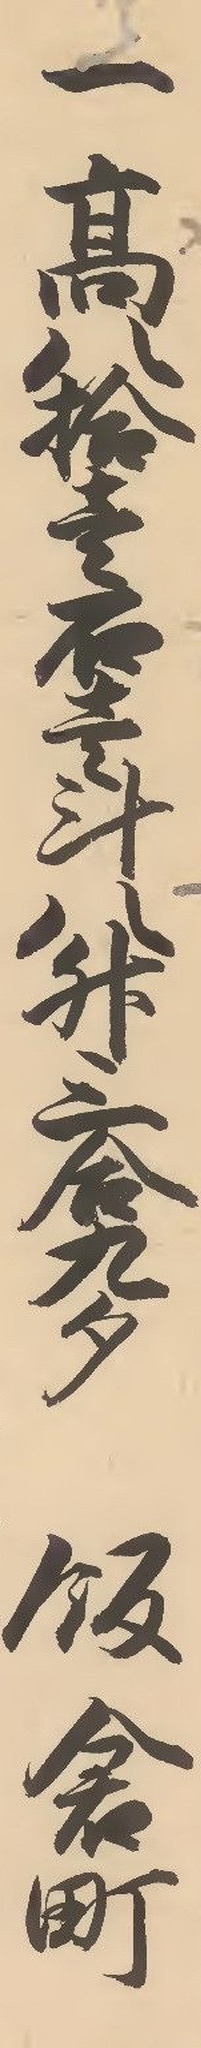一高八拾壱石壱斗八升三合九勺飯倉町
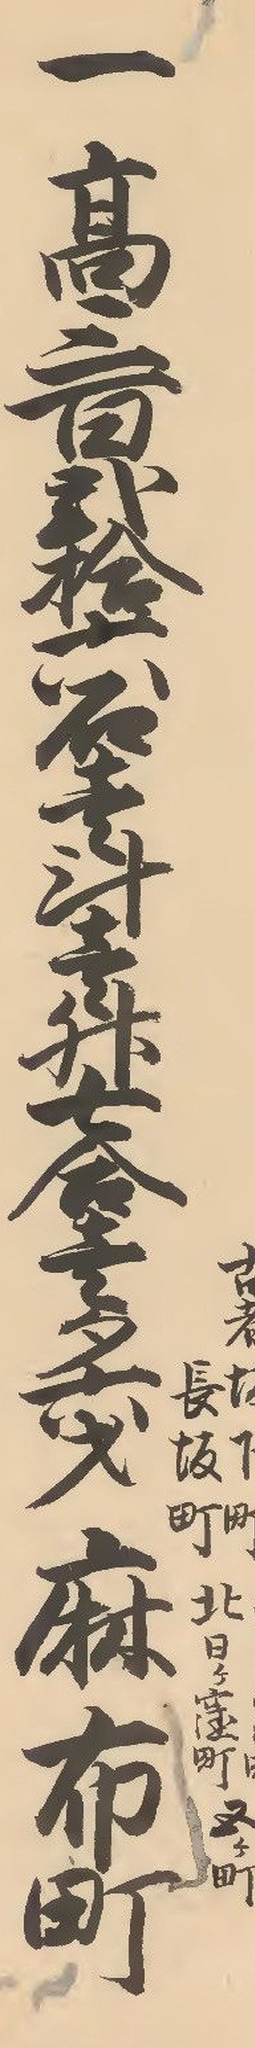一高三百弐拾六石壱斗壱升七合壱勺六才麻布町
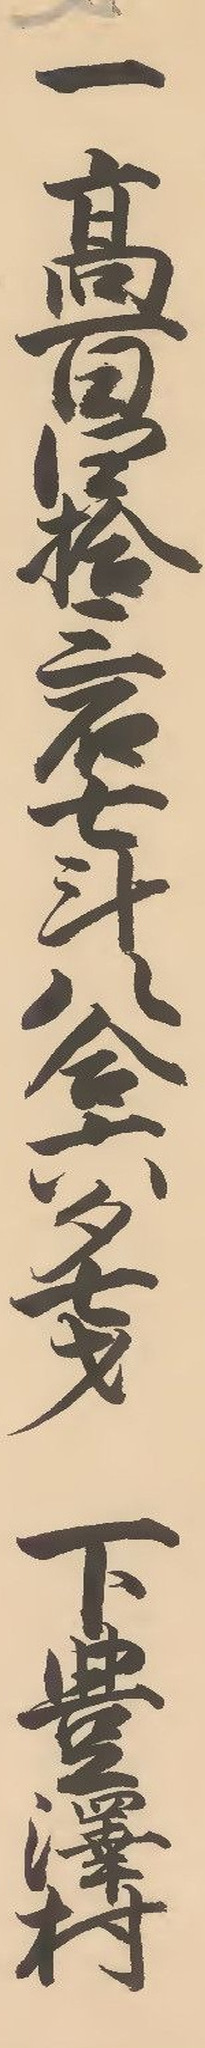一高百四拾三石七斗八合六勺七才下豊澤村
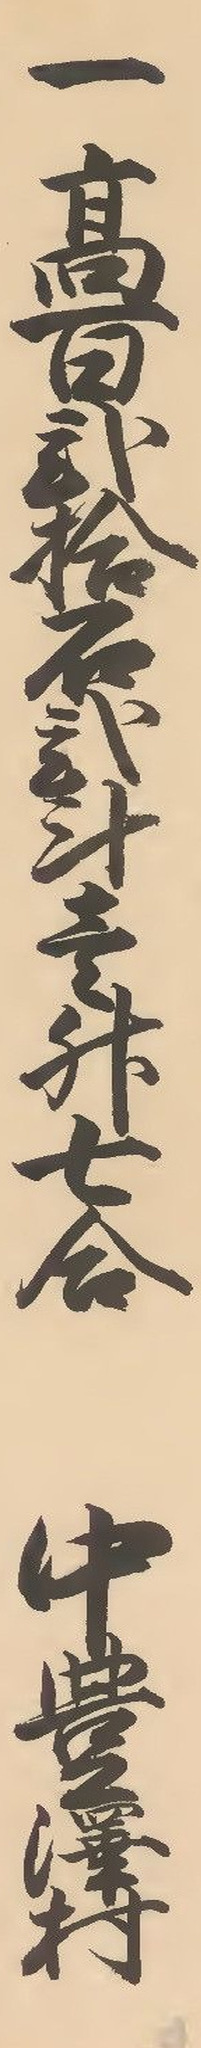一高百弐拾石弐斗壱升七合中豊澤村
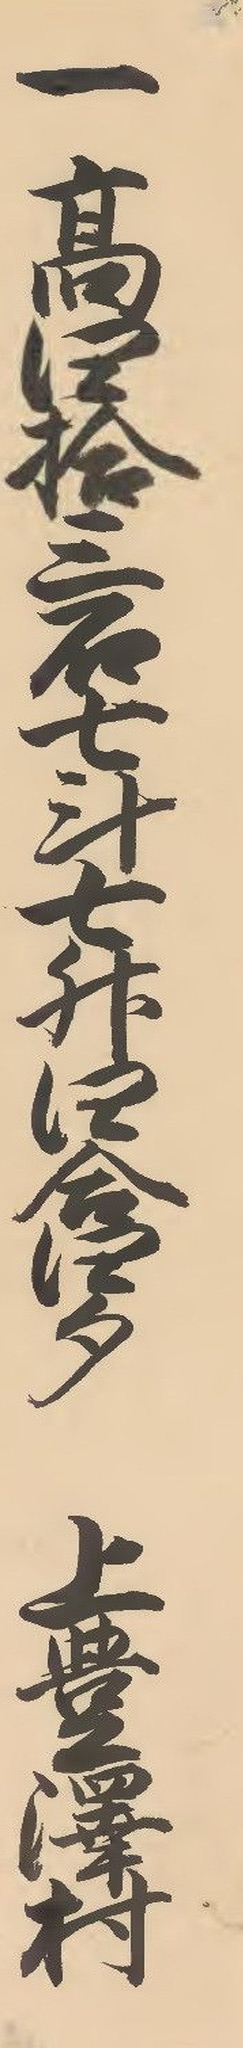一高四拾三石七斗七升四合四勺上豊澤村
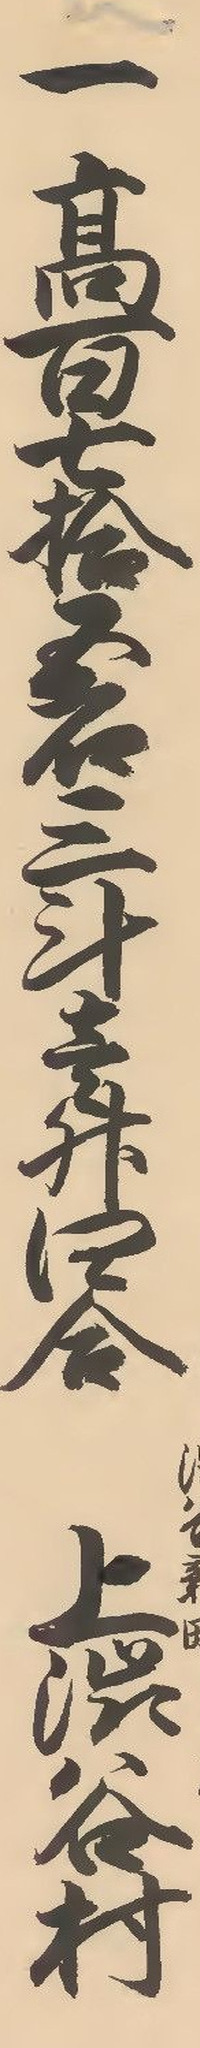一高百七拾五石三斗壱升四合上渋谷村
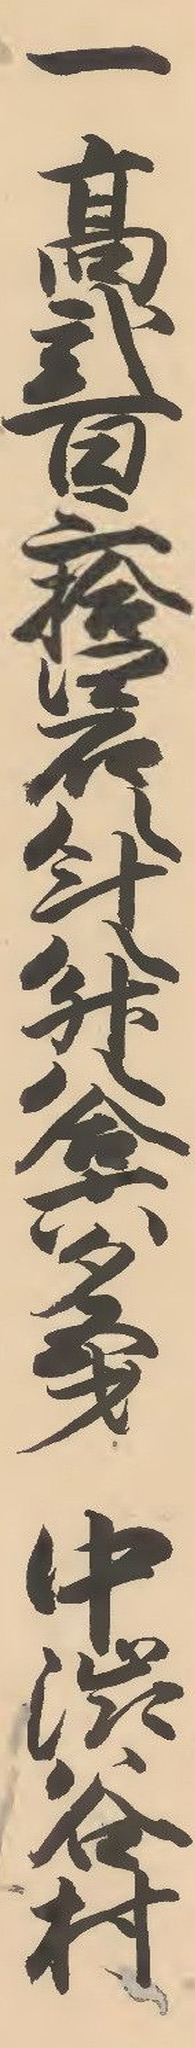一高弐百三拾四石八斗八升八合六勺五才中渋谷村
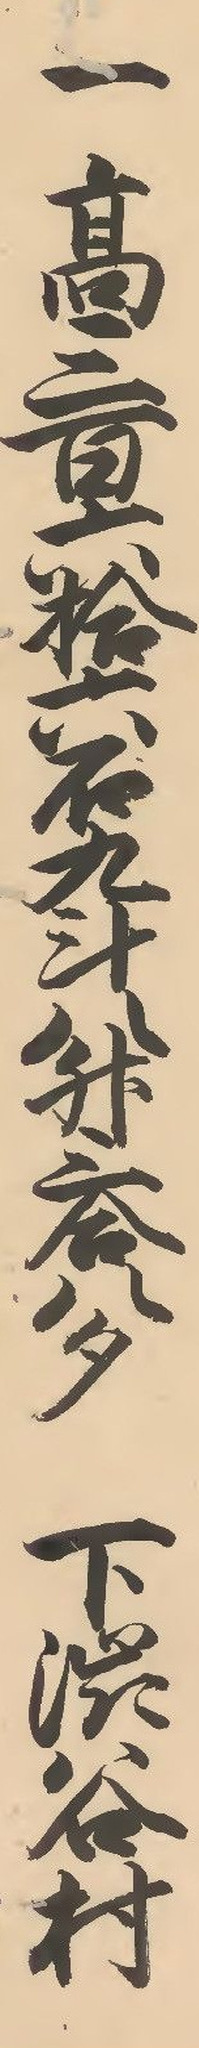一高三百六拾六石九斗八升三合八勺下渋谷村

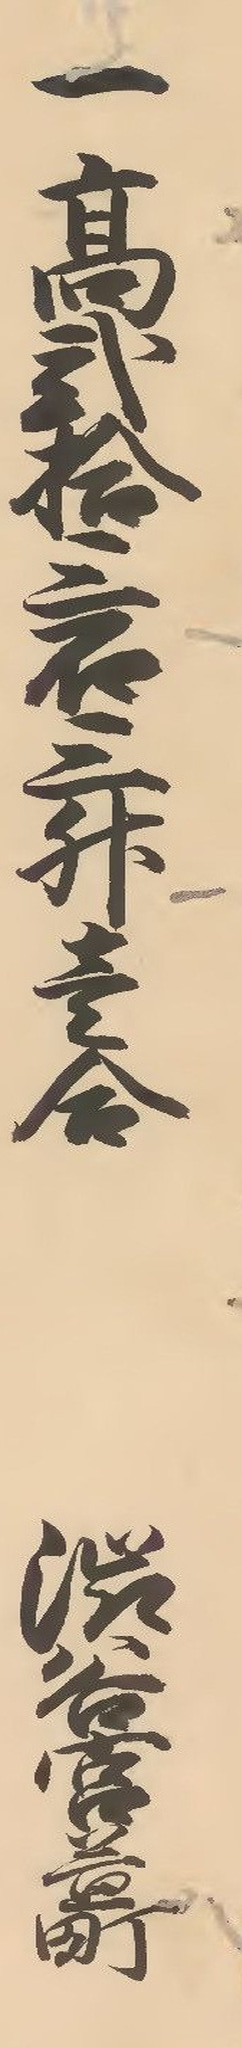一高弐拾三石三升壱合渋営宮前町
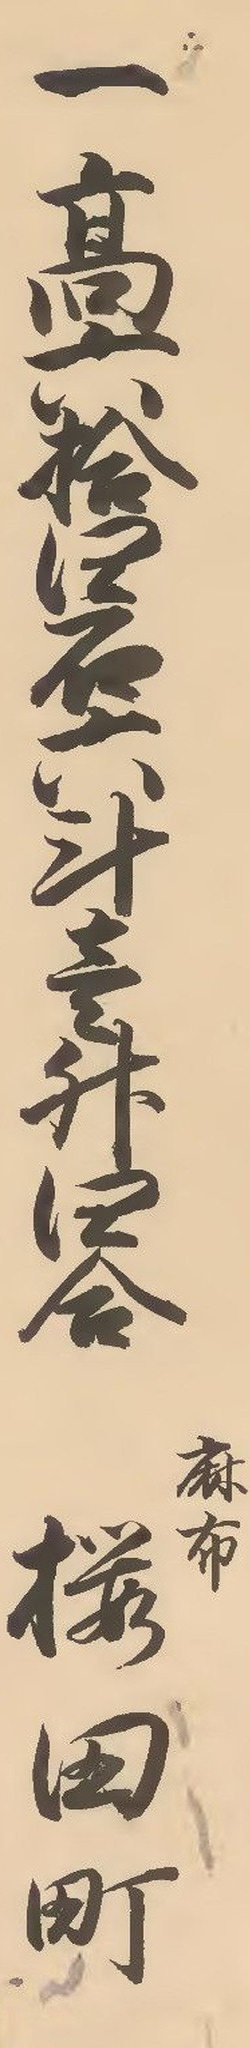一高六拾四石六斗壱升四合桜田町
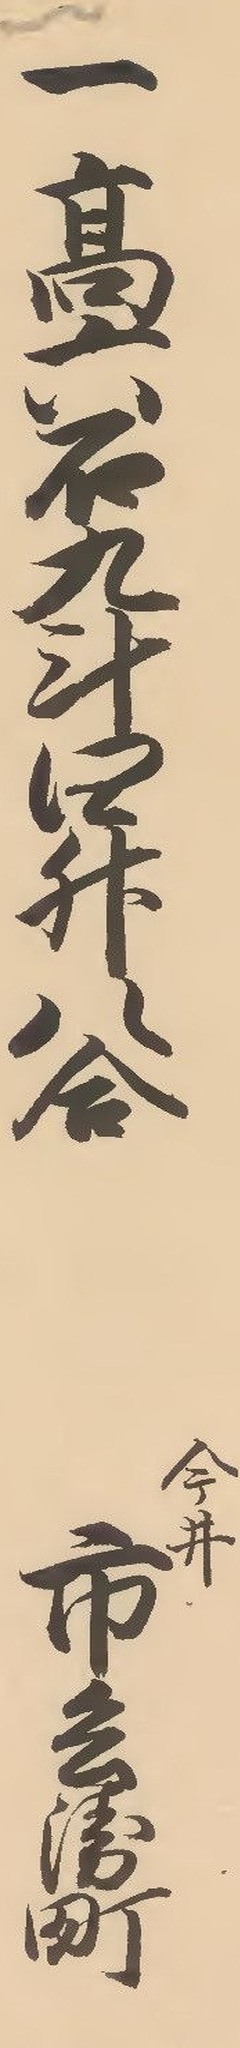一高六石九斗四升八合市兵衛町
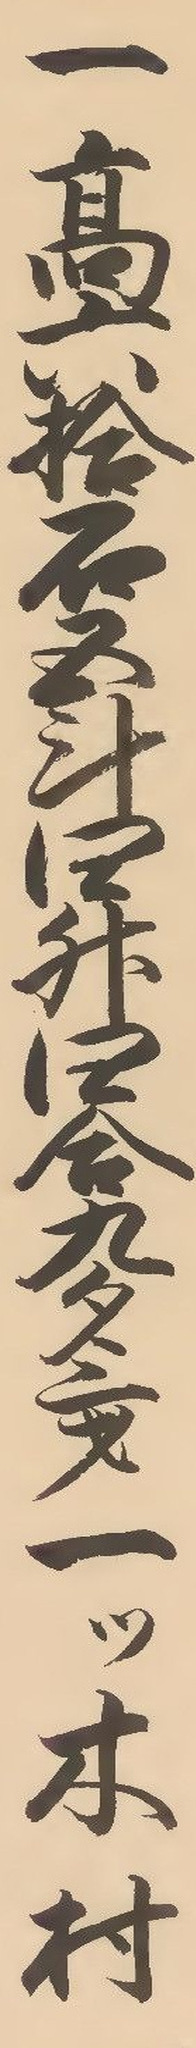一高六拾石五斗四升四合九勺三才一ッ木村
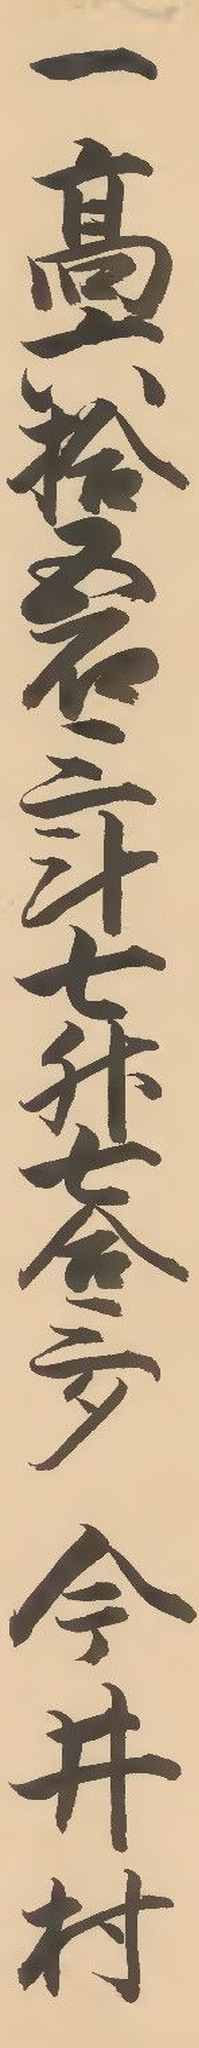一高六拾五石三斗七升七合三勺今井村
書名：武蔵国郷帳　上
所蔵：国立公文書館 National Archives of Japan
